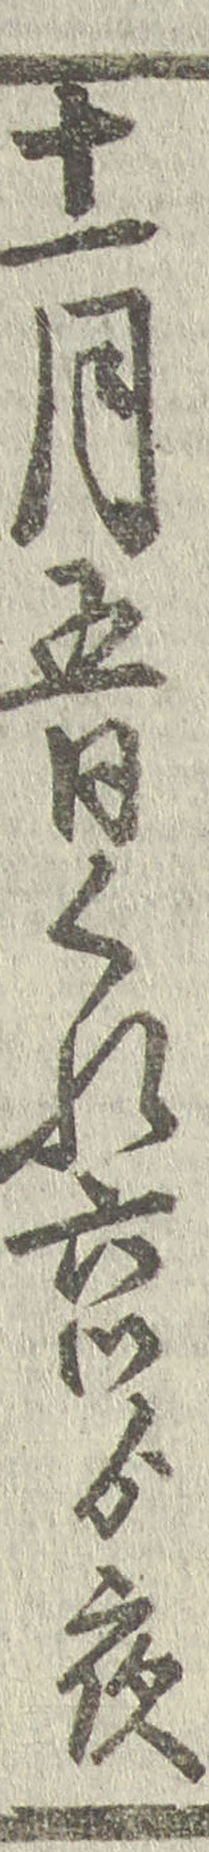十一月五日くれ六つより夜
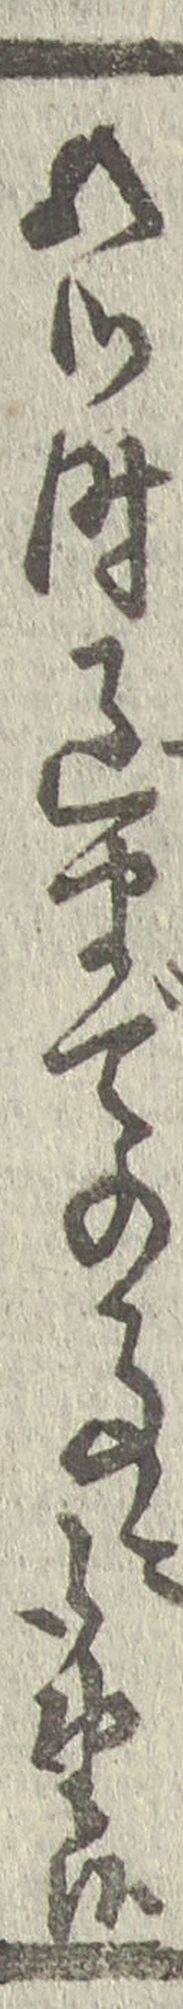五つ時過までの事に御座候
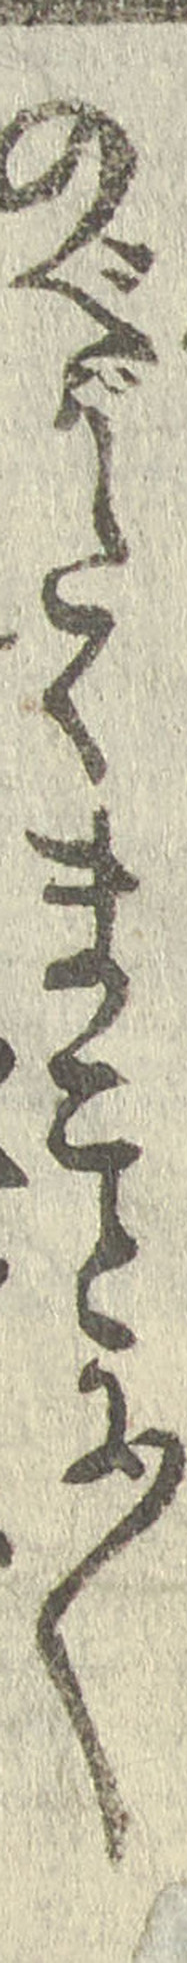のべがたくまことに〳〵
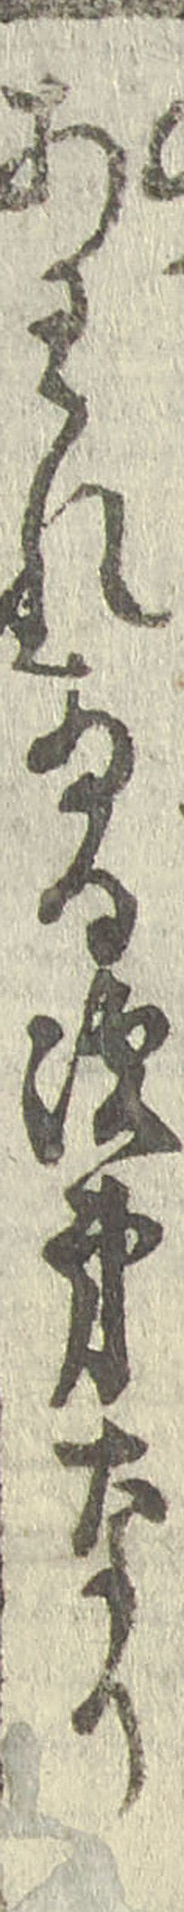あわれなる次第なり
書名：諸国大地震大津波 三編
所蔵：東京大学総合図書館 General Library in the University of Tokyo, JAPAN
